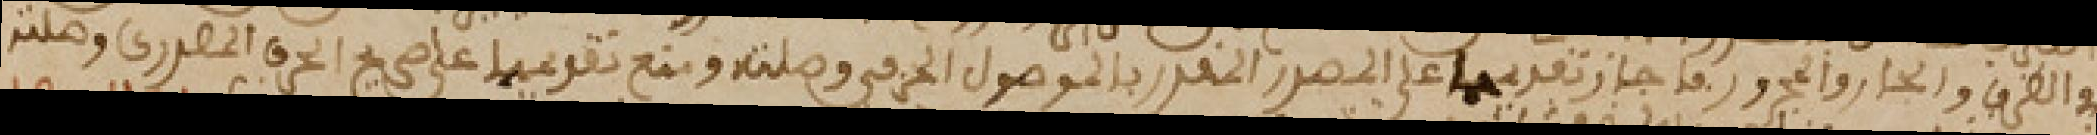في الظرف و الجار و المجرور فاجاز تقدمها على المصدر المقرر بالموصول الحرفي و صلته و منع تقديمها على صريح الحرف المصدري و صلته
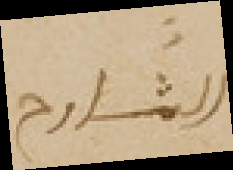الشارح
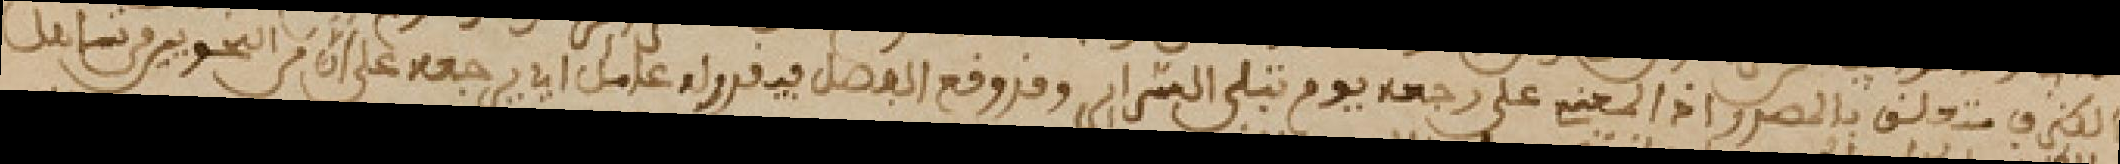الكزب متعلق بالمصدر اذا المعنى على رجعه يوم تبلى الشراين و قد وقع الفضل فيقرر له عامل اي يرجعه على ان من النحويين قد تساهل
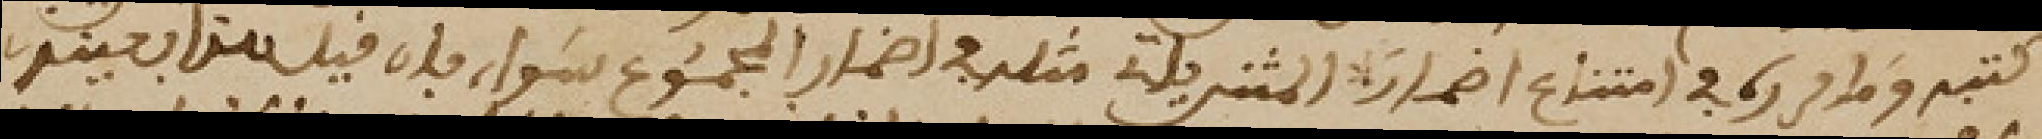كتبه و ما حرره في امتناع اضمارالمثنى ياتي مثله في اضمار المجموع سواء بان قيل هذا بعينه
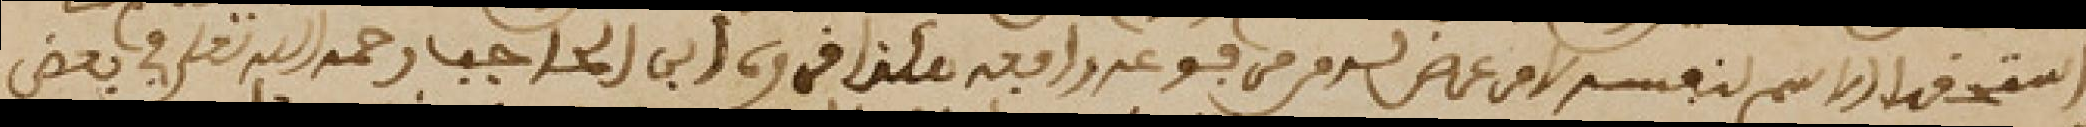استحقها الاسم لنفسه لا من عرض له مرفوعه و ابعد هكذا في رد الحاجب رحمه الله تعالى في بعض
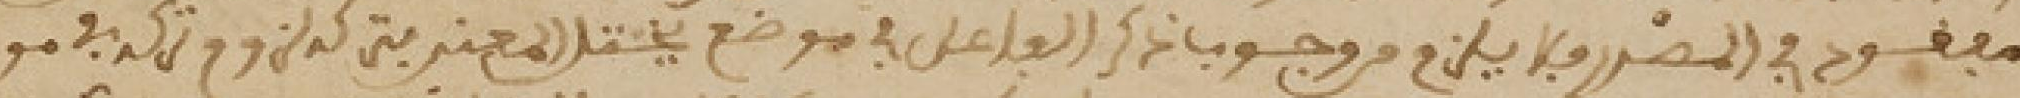مفهوم في المصدر فلا يلزم من وجوب ذكر الفاعل في موضع يختل المعنى بتركه لزوم تركه في مو
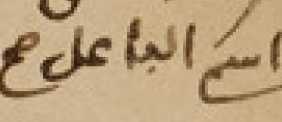اسم الفاعل
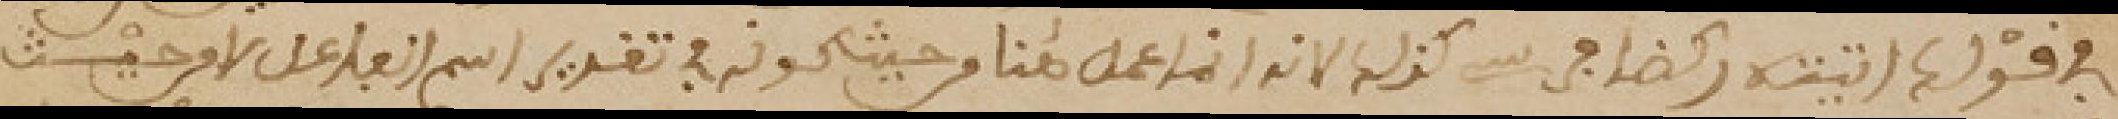بقولك اتيت ركضا في سكزلة لانه انما عمل هنا من حيث كونه في تقدير اسم الفاعل لا من حيث
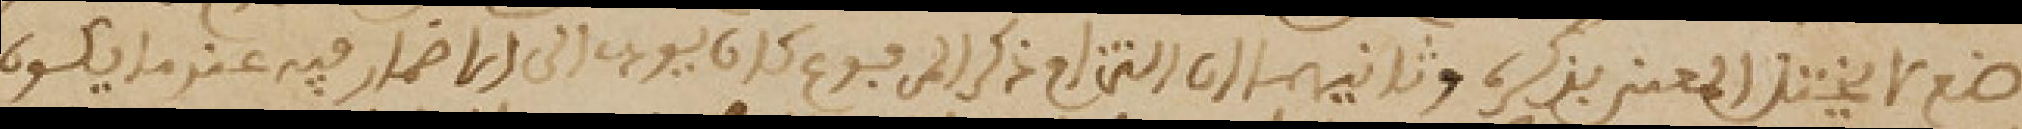ضع لا يختل المعنى بذكره و ثانيهما ان التزام ذكر المرجوع كان يرجع الى ان اضمار فيه عندما يكون
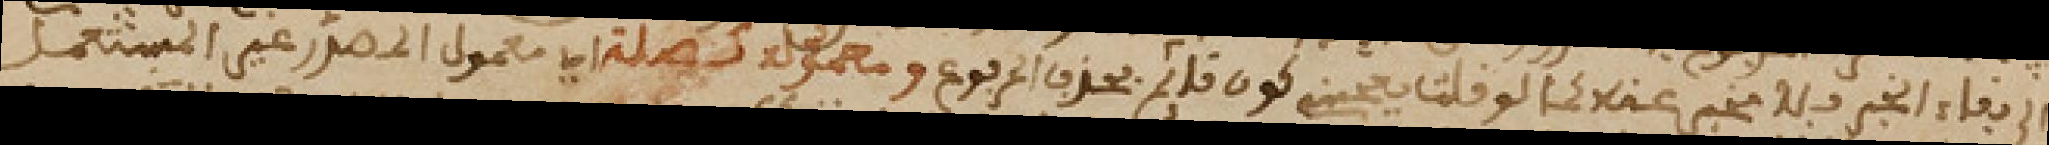الى بقاء الخبر فلا مخبر عملا كما قلت يعجبني كون قاىم بحرف المرفوع و معمولة كصلة اي معمول المصدر غير المستعمل
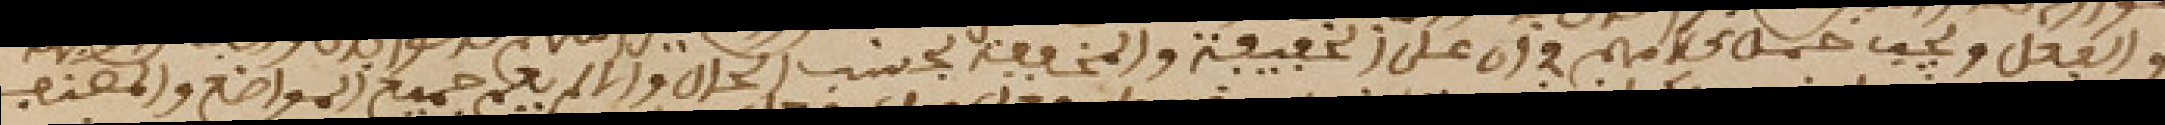والفعل و يجب حمل كلامهم في ان على الخفيفة والمخففة بحسب الحال والا لم يعم جميع المواضع والمصنفة
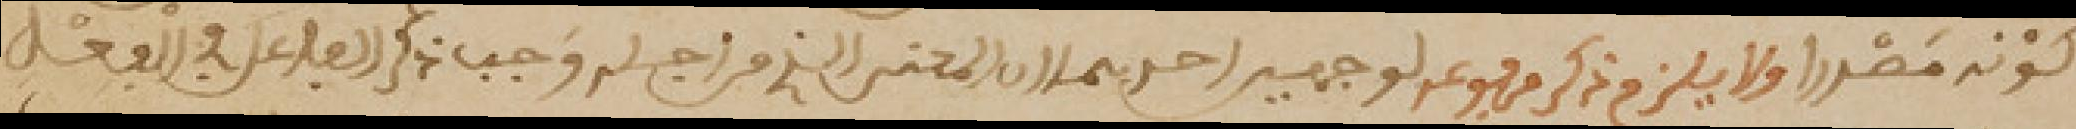كونه مصررا ولا يلزم ذكر مجموعة لو جهيز احد بما ان المعنى الذيمن اجله وجب ذكر الفاعل في الفعل
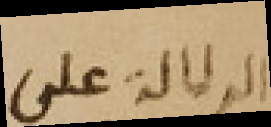الدلالة على
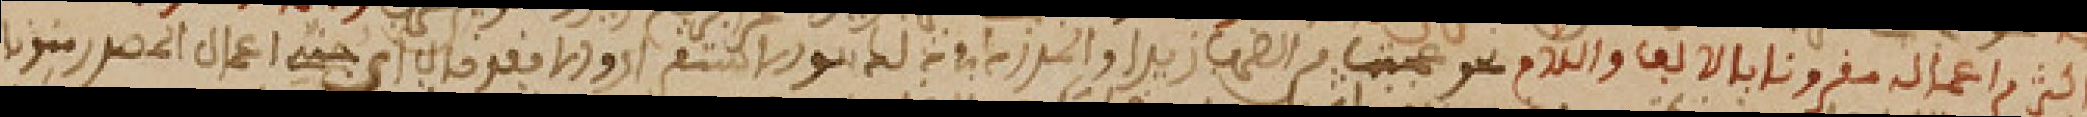اكثر من اعمال مقرونا بالاف و الكلام نحو عجبت في آلضرب زيدا و الموزد في ذلك هوا باستقراألا فقو حال اي جني اعماله المصدر منونا
